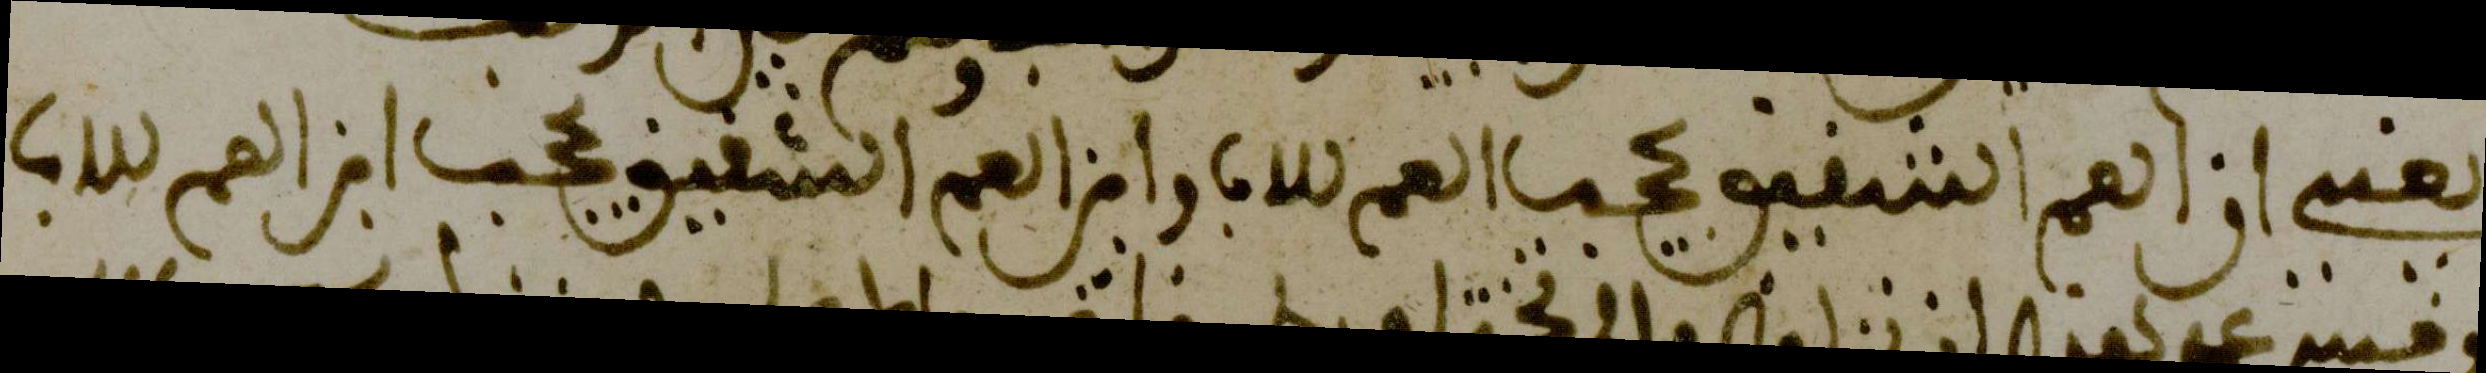يعني ان العم الشقيق يحجب العم للاب وابن العم الشقيق يحجب ابن العم للاب
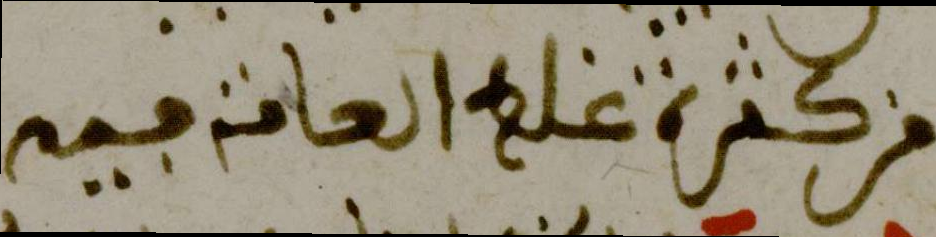من كثرة غلط العامة فيه
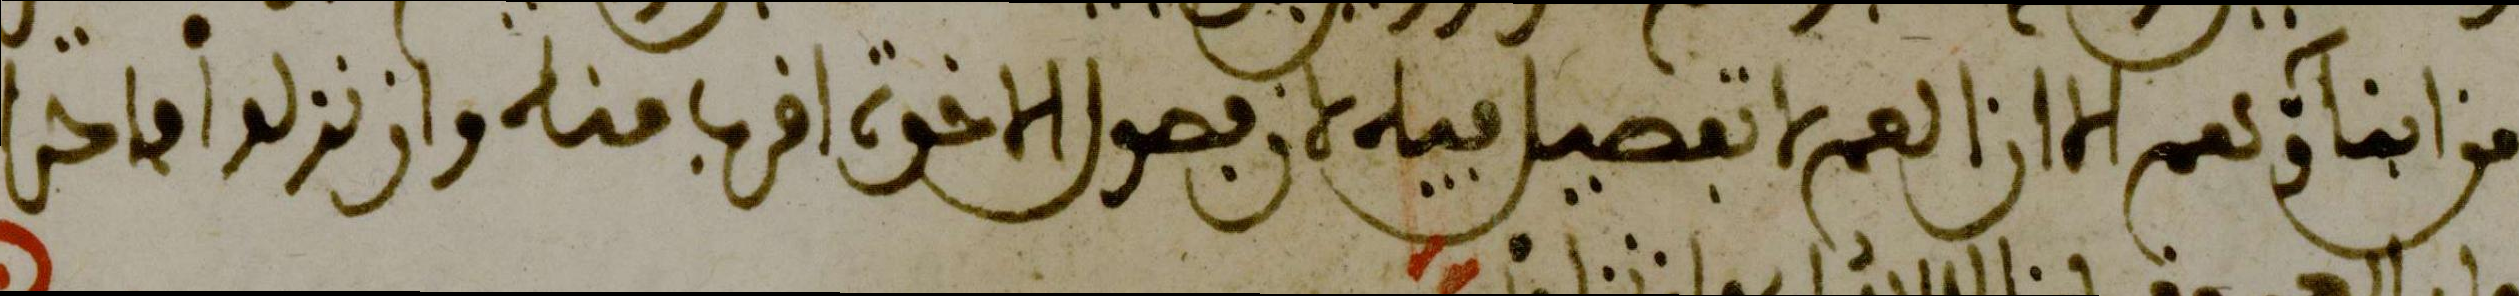من ابناؤهم الا ان العم لا تفصيل فيه لان فصول الاخوة اقرب منه وان نزلوا فاحرا
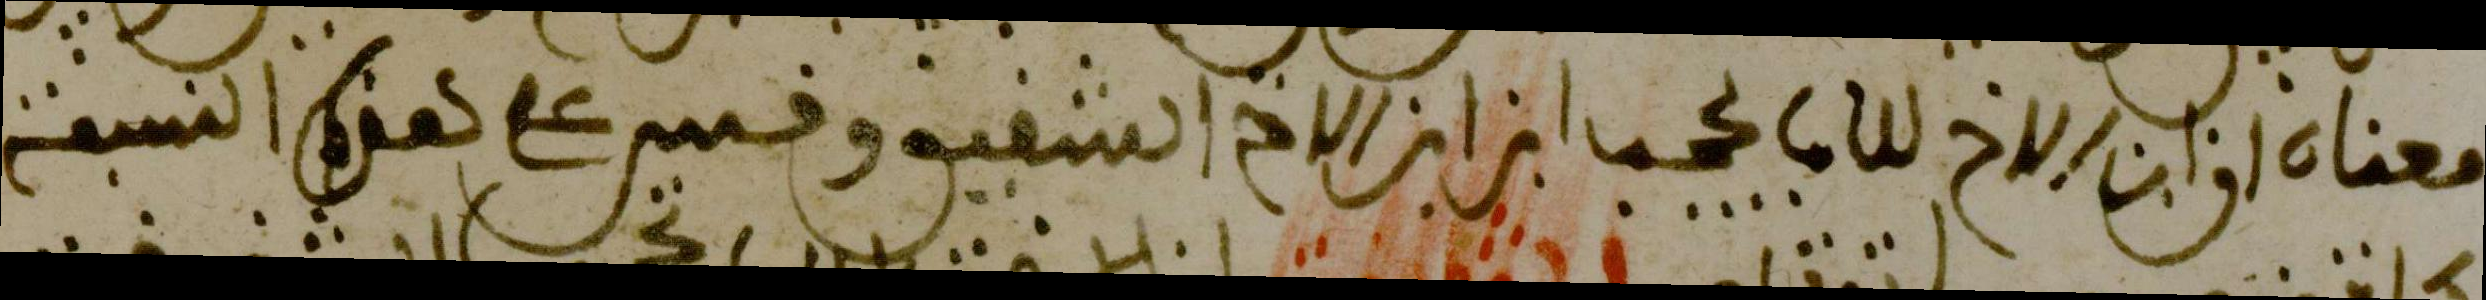معناه ان ابن الاخ للاب يحجب ابن ابن الاخ الشقيق وقس على هذا النسبة
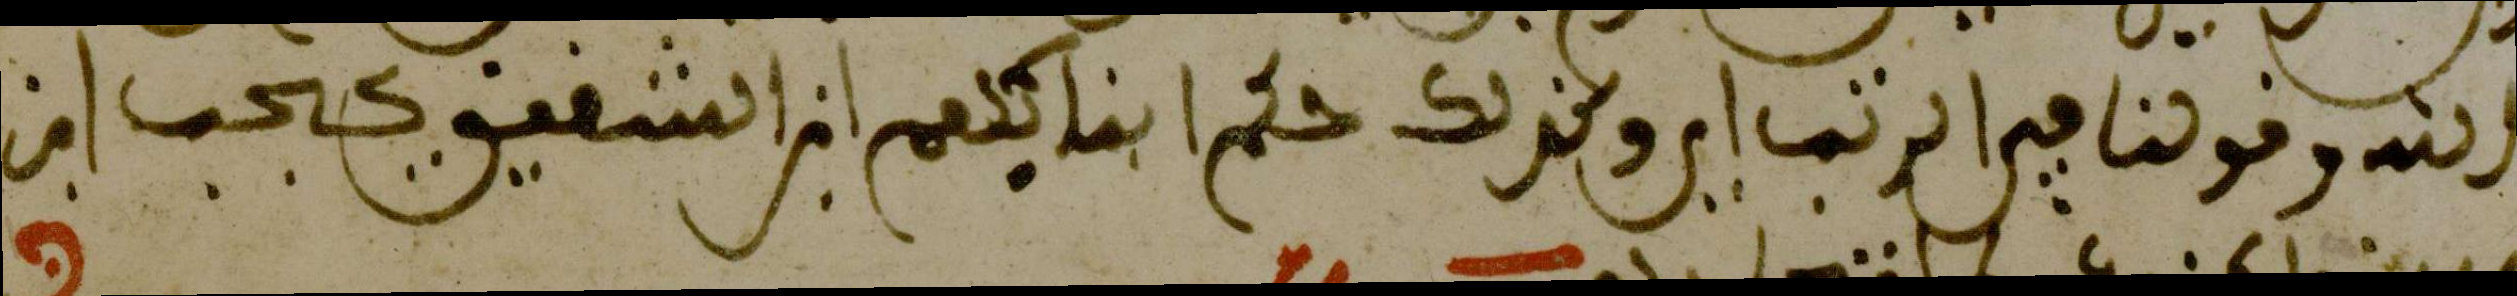الله وقولنا في الرتب اي وكذلك حكم ابنائهم ابن الشقيق يحجب ابن
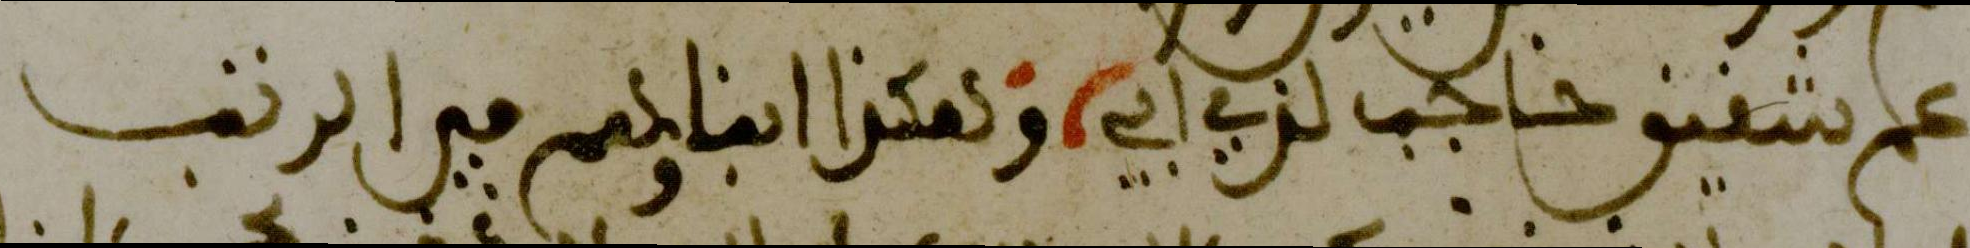عم شقيق حاجب لذي ابي وهكذا ابناوهم في الرتب
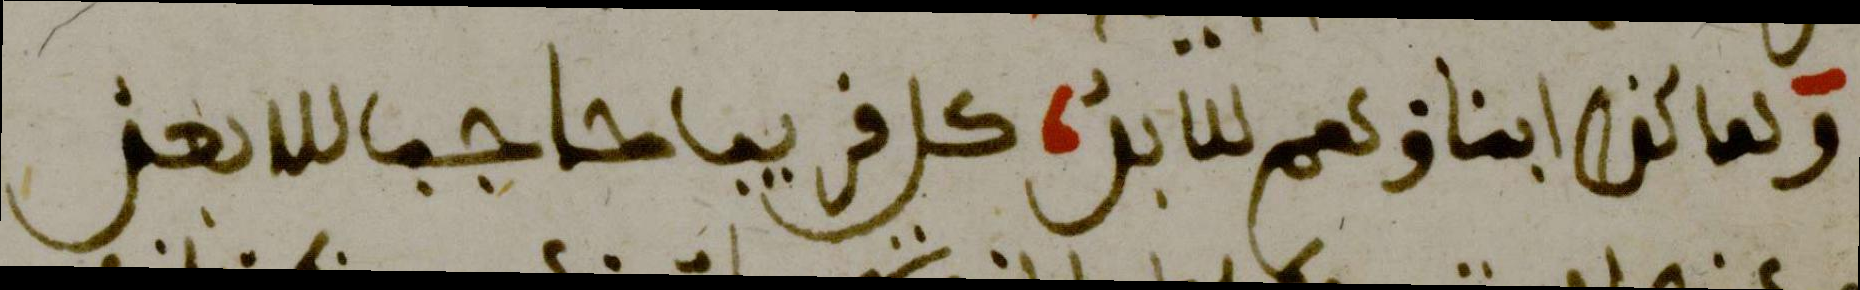وهاكذا ابناؤهم للابد كل قريب حاجب للابعد
